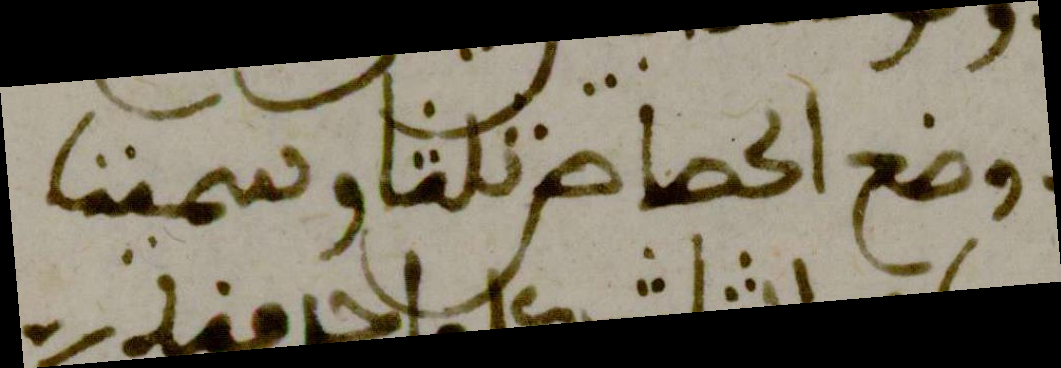وضع الحصاص ثلثا وسميت
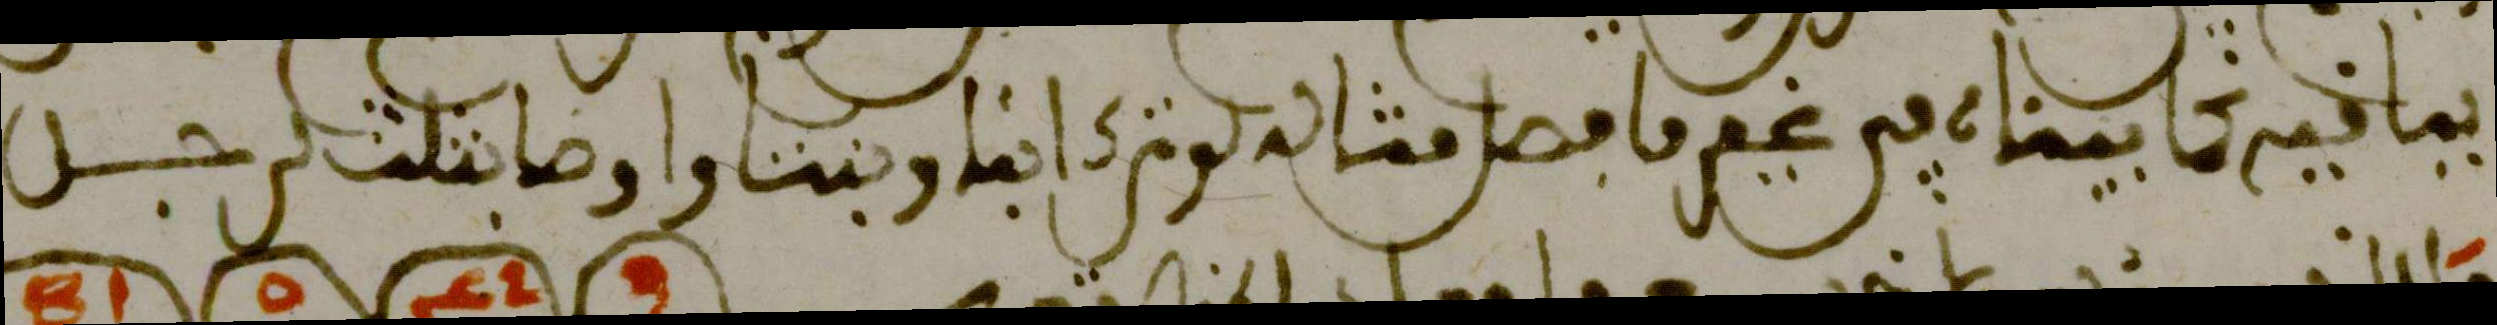بباقيه كما بيناه في غير ما فصل مثاله لو ترى ابنا وبنتا واوصا بثلث لرجل
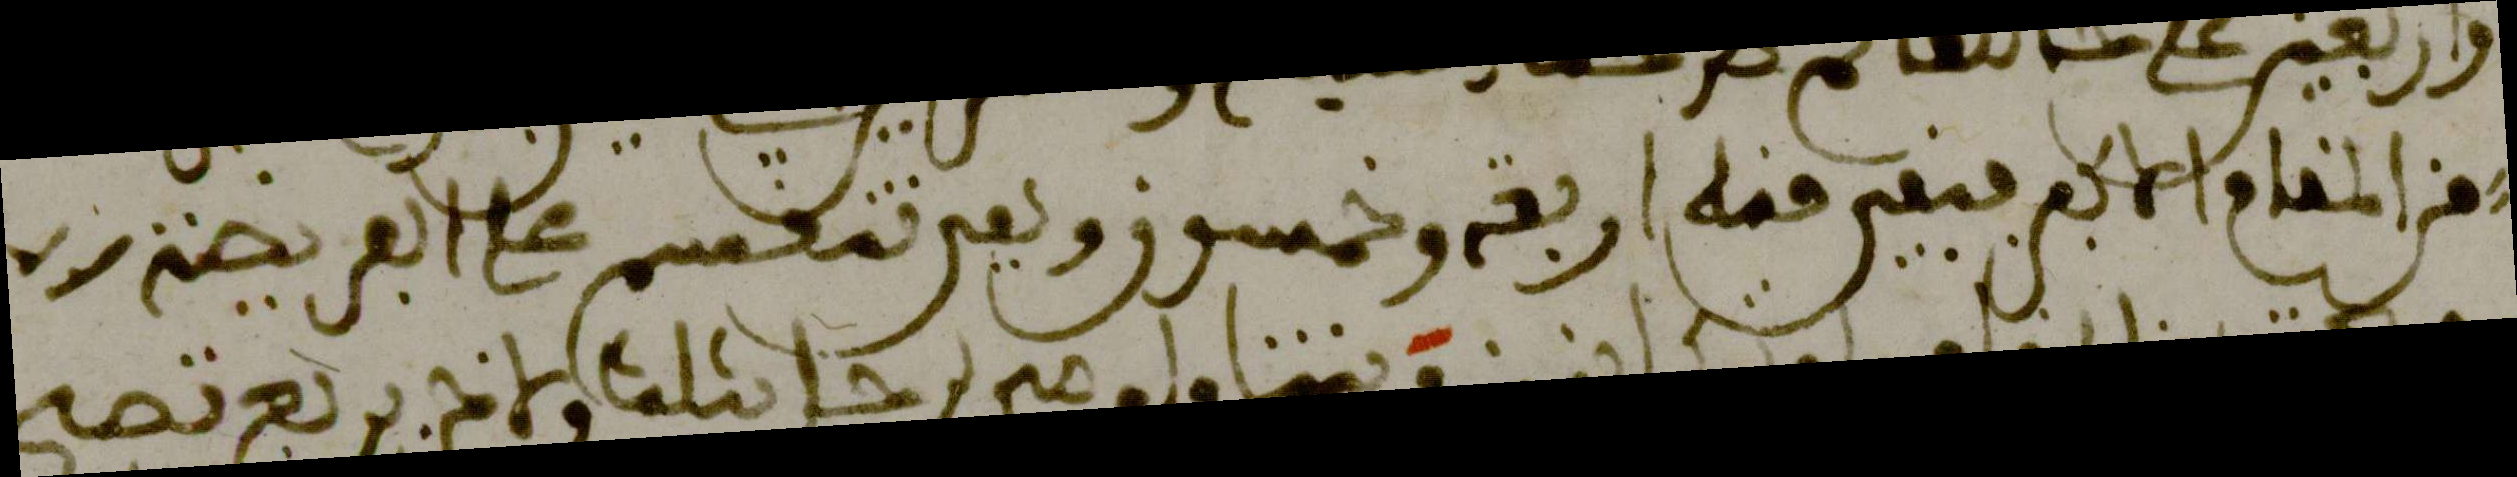من المقام الاكبر فبقي منه اربعة وخمسون وهي تنقسم على الفريضة
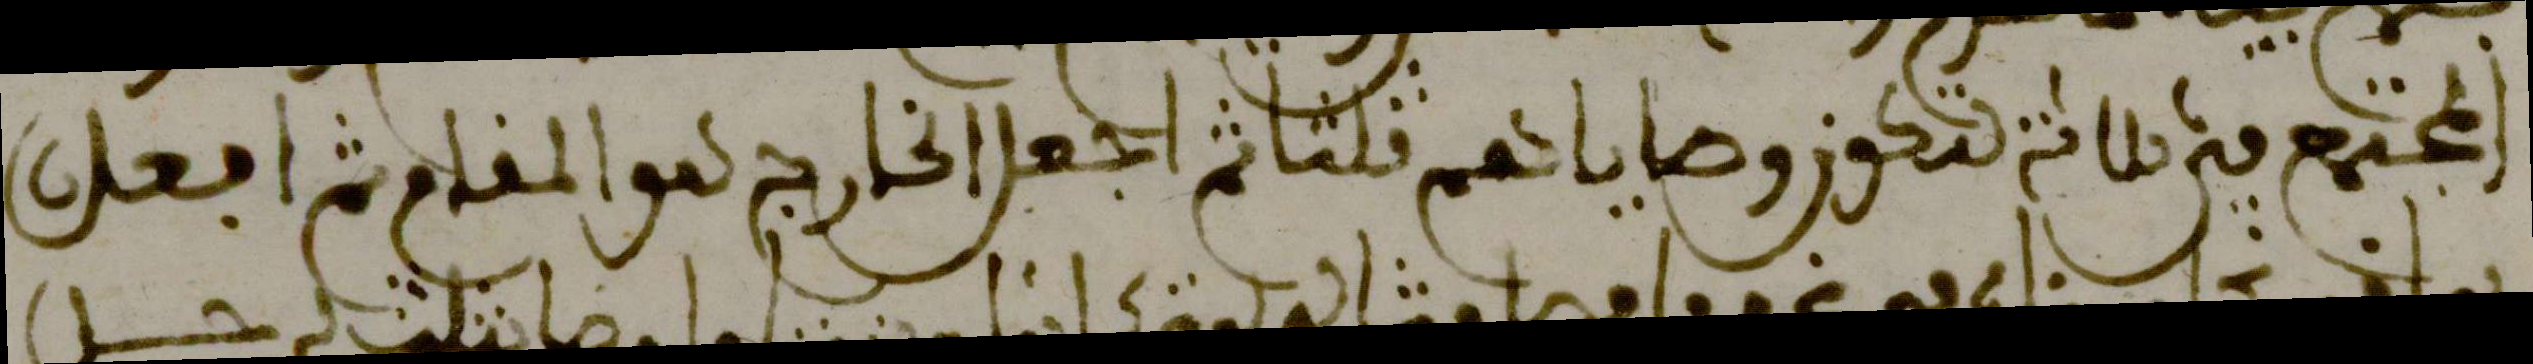المجتمع في ثلاثة لتكون وصاياهم ثلثا ثم اجعل الخارج هو المقام ثم افعل
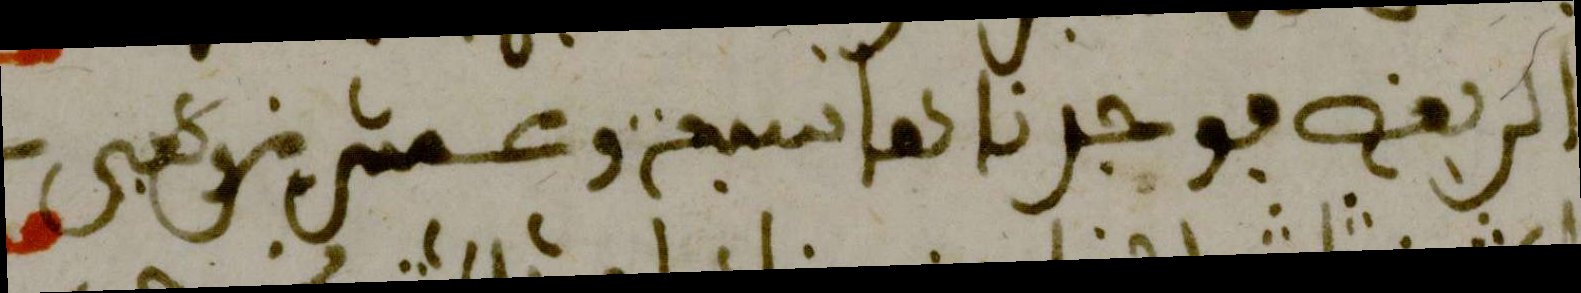الى بعض فوجدناها سبعة وعشرين وهي
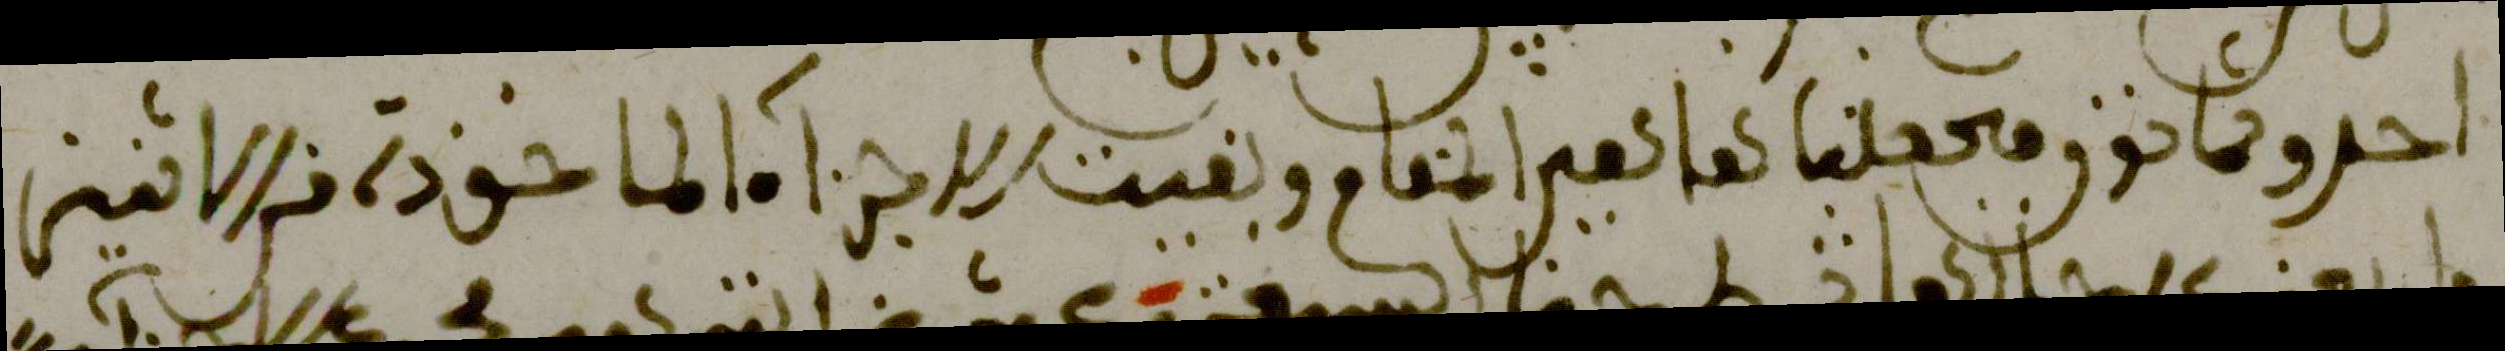احد وثمانون فجعلناها هي المقام وبقيت الاجزاء الماخوذة من الاثنين
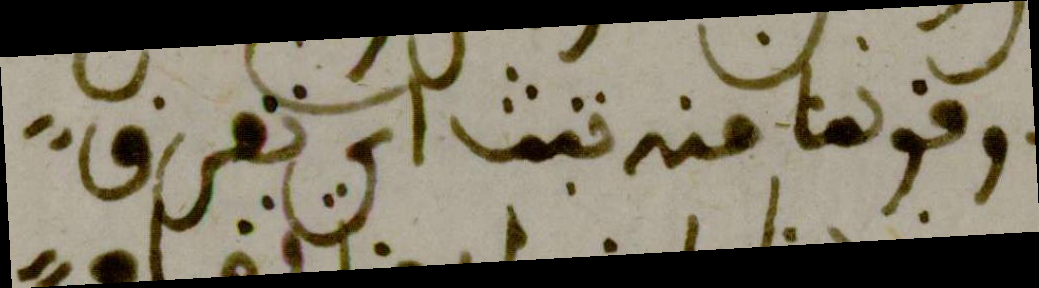وقولنا منه تبث اي تفرق
